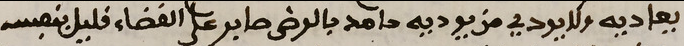يعاديه ولا يرد في من يوديه حامد بالرض صابر على القضاء قليل بنفسه
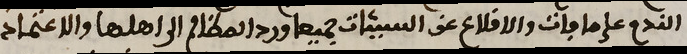الندم على ما فات والاقلاع عن السيئات جميعا ورد المظالم الى اهلها والاعتماد
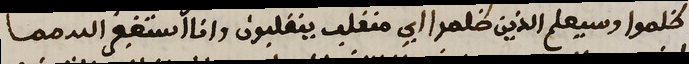ظلموا وسيعلم الذين ظلموا اي منقلب ينقلبون وانا استغفر الله مما
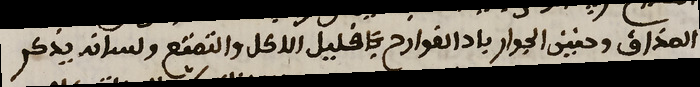المذاق و حنين الجوار باد القوارح قليل الاكل والتمتع و لسانه يذكر
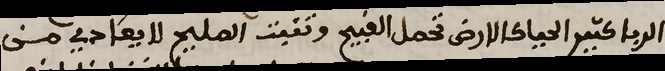الربا كثير الحيا كالارض تحمل القبيح وتنبت المليح لا يعادي من
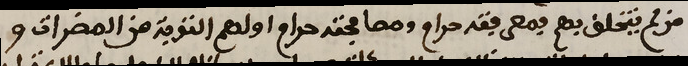من لم يتخلق بهم بمعرفته حرام ومصافحته حرام اولهم التوبة من المضرات و
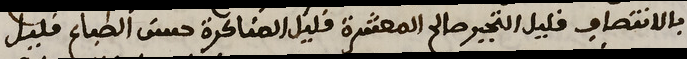بالانتصاف قليل التجبر صالح المعشرة قليل المناكرة حسن الطباع قليل
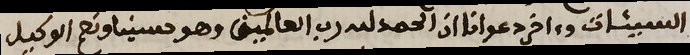السيئات وءاخر دعوانا ان الحمد لله رب العالمين وهو حسبنا ونعم الوكيل
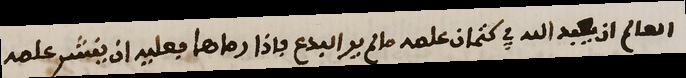العالم ان يعبد الله في كتمان علمه ما لم ير البدع فاذا رماها فعليه ان ينشر علمه
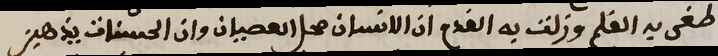طغى به القلم و زلت به القدم ان الانسان محل العصيان و ان الحسنات يذهبن
